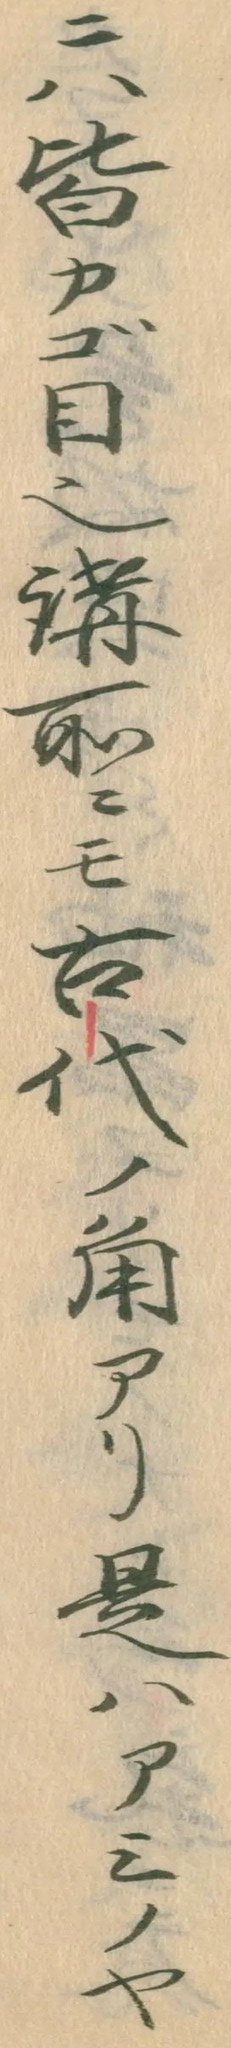ニハ皆カゴ目也講所ニモ古-代ノ角アリ是ハアミノヤ
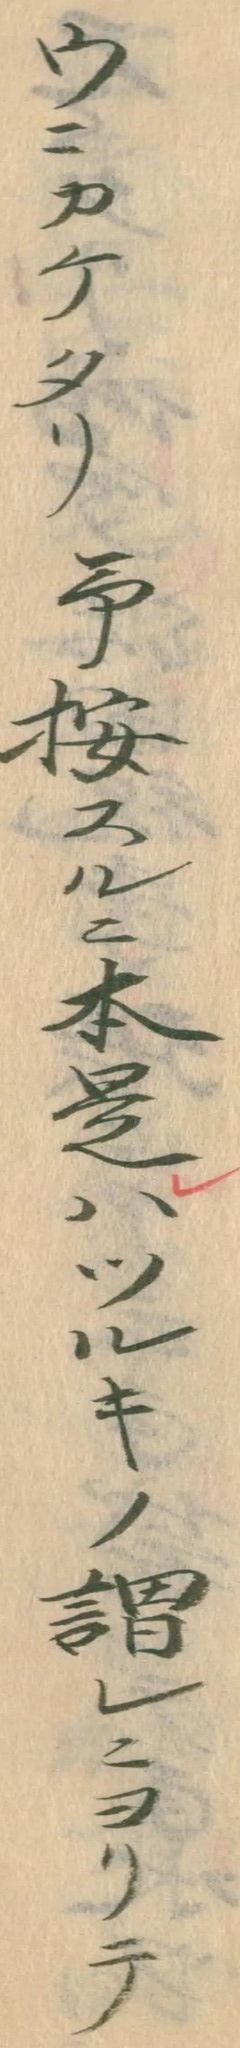ウニカケタリ予按スルニ本是ハツルキノ謂レニヨリテ
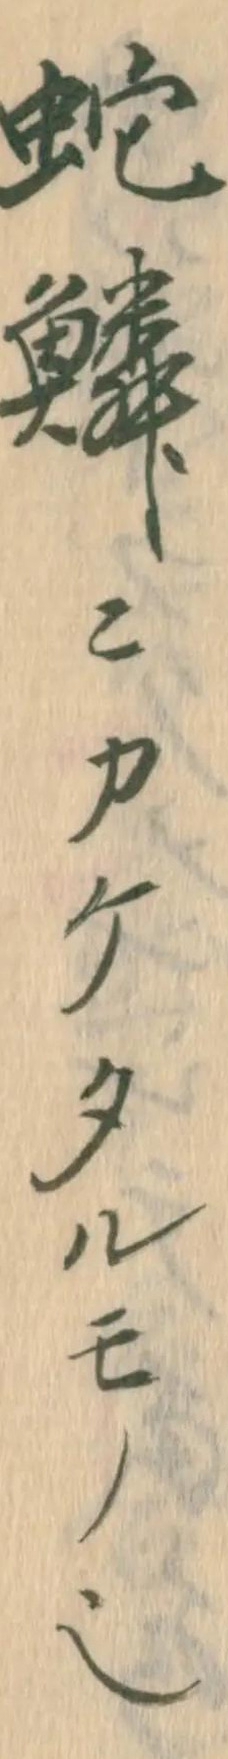蛇鱗ニカケタルモノ也
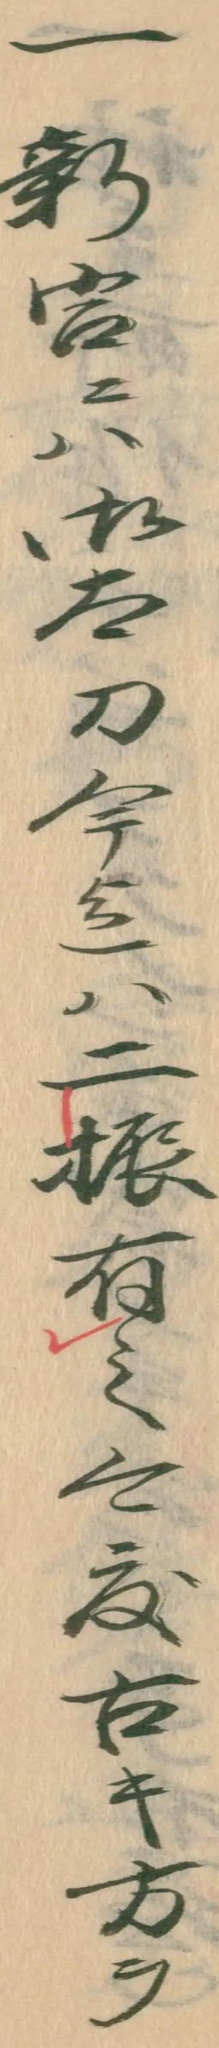一新宮ニハ御太刀今迄ハ二_振有之今度古キ方ヲ
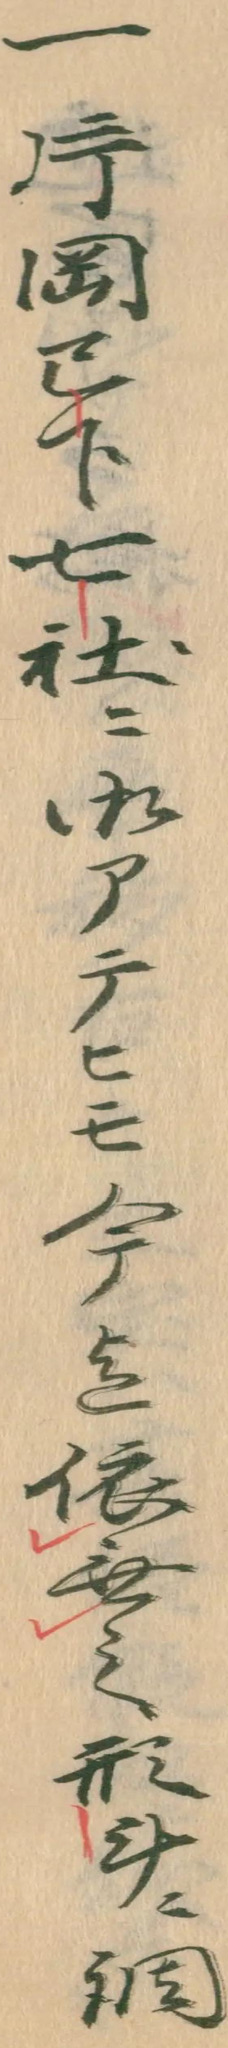一片岡已-下七-社ニ御アテヒモ今迄依無之形_計ニ調
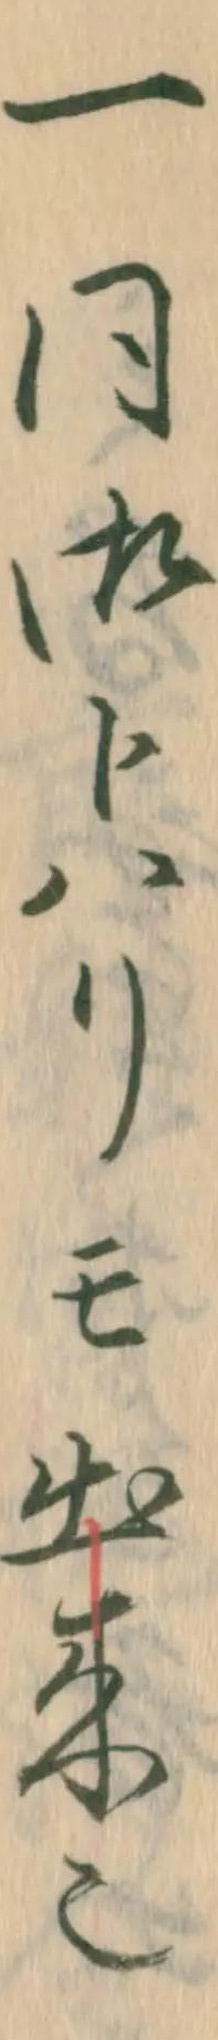一同御卜ハリモ出-来也
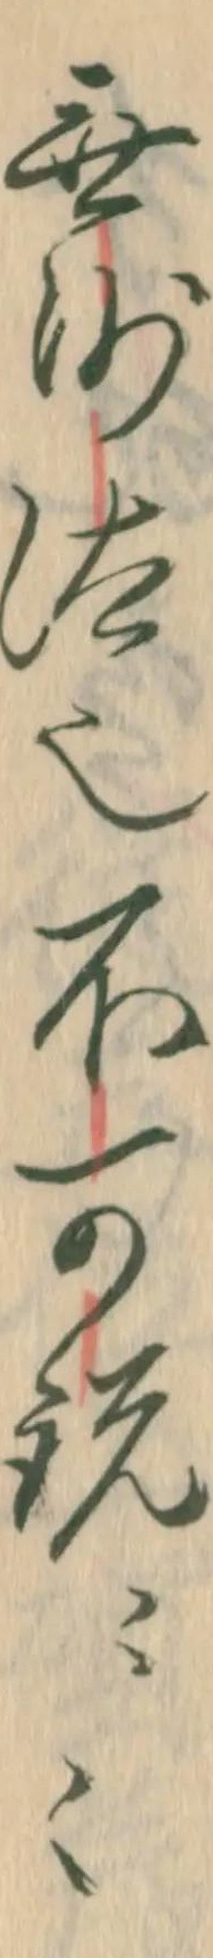無-沙-汰也不-可-説々々
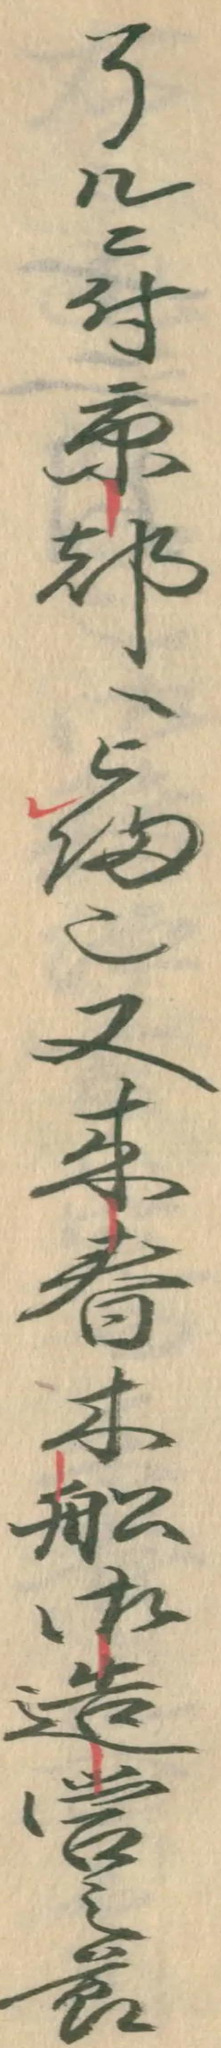了ルニ付京-都へ被帰也又来-春木_船御-造-営之節
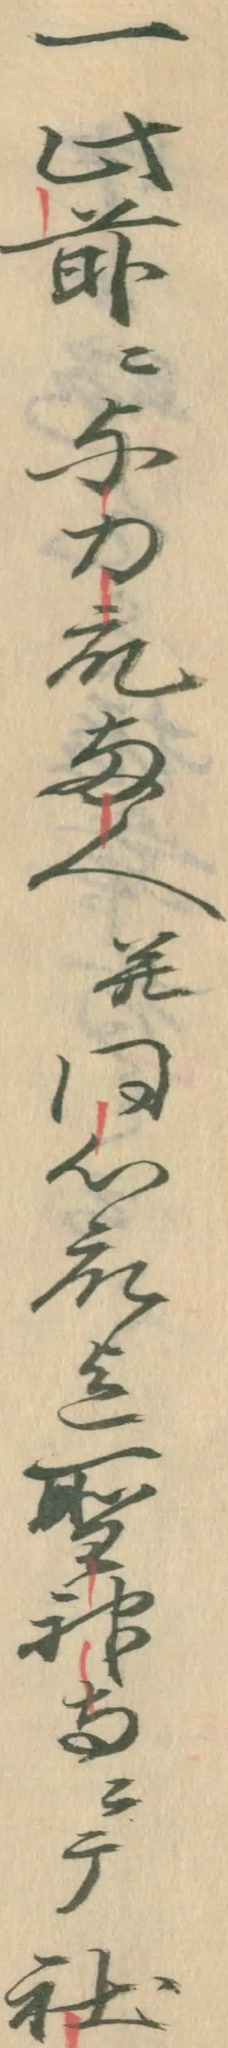一此_前ニ与-力-衆両-人并同-心衆迄聖-神-寺ニテ社-

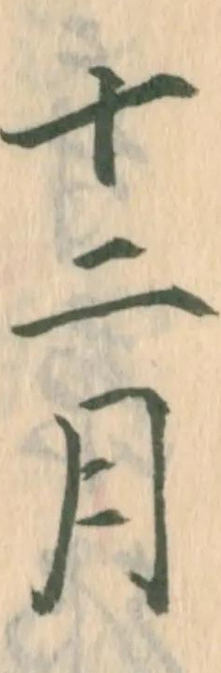十二月
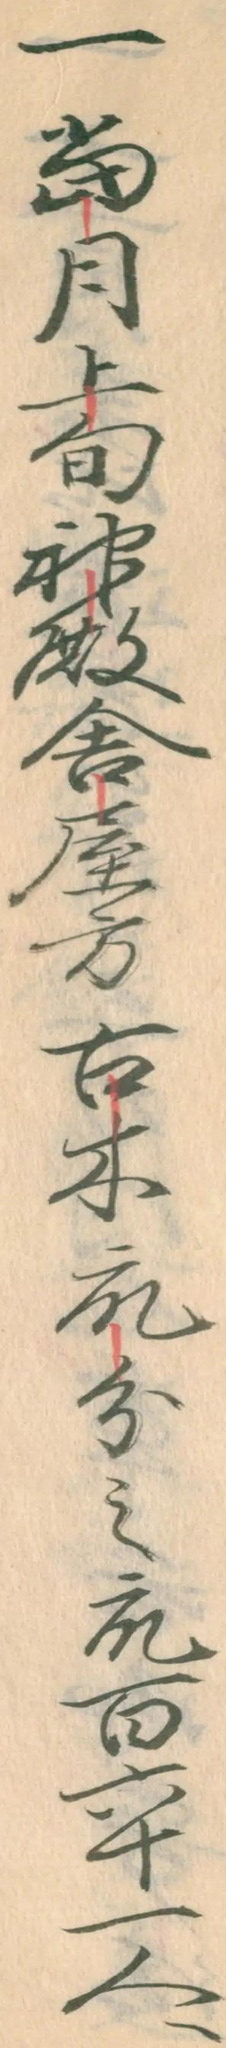一当-月上-旬神-殿舎-屋方古-木衆-分之衆百六十一人ヘ
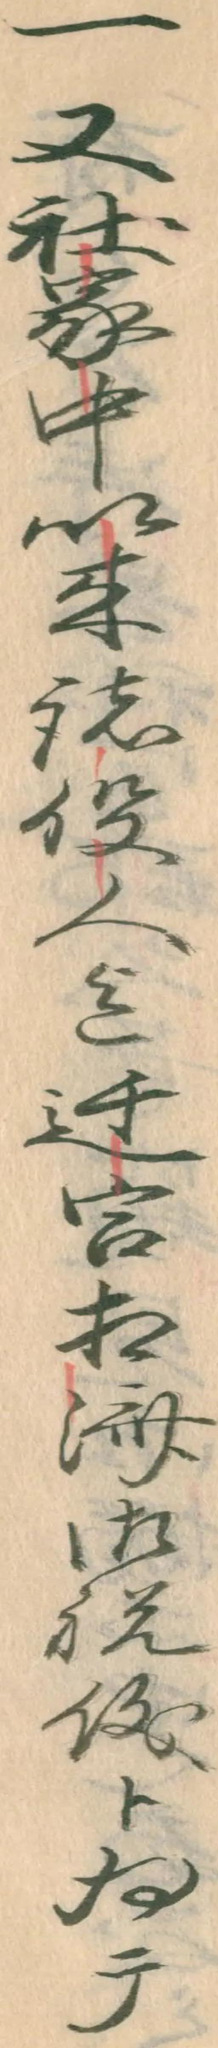一又社-家-中以-来諸-役-人迄迁-宮相_済御祝儀ト為テ
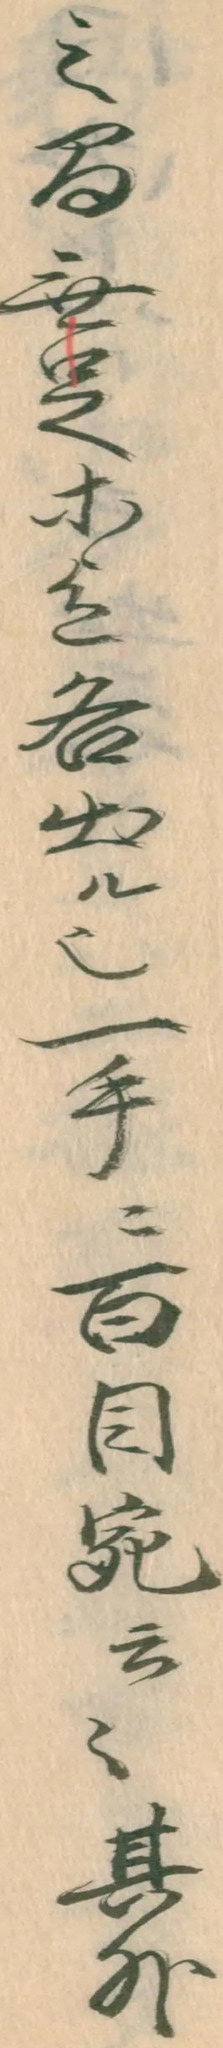之間無-足等迄各出ル也一手ニ百目宛云々其外
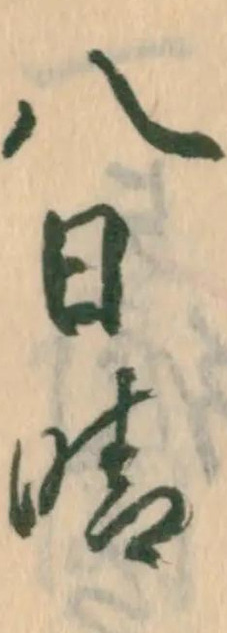八日晴
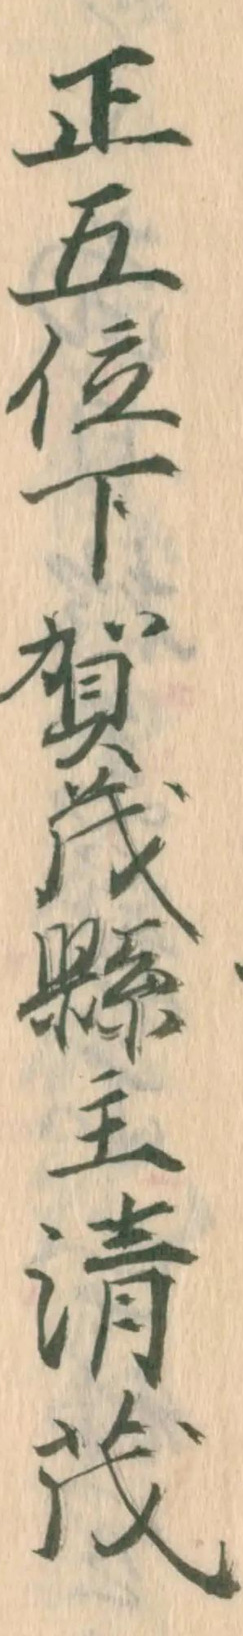正五位下賀茂県主清茂
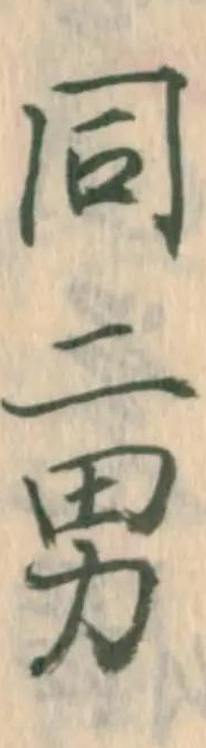同二男
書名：賀茂社記録. 第16冊
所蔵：国立国会図書館 National Diet Library, JAPAN
